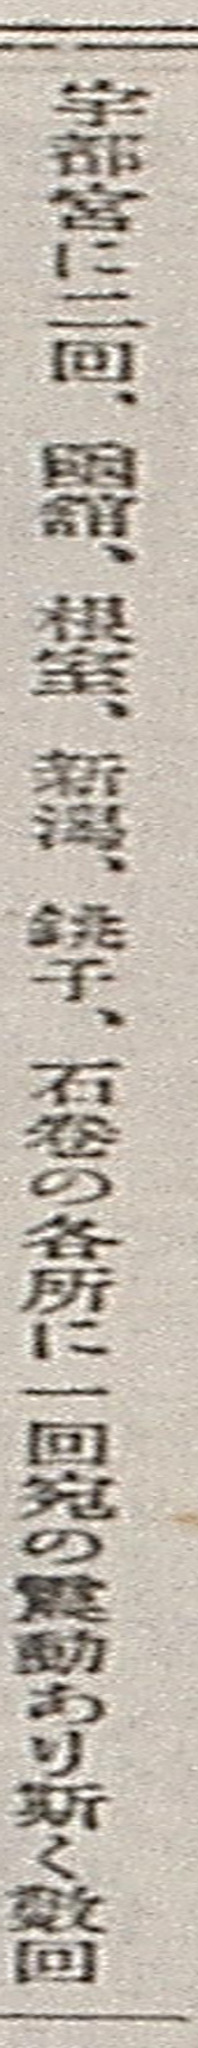宇都宮に二回、函館、根室、新潟、銚子、石巻の各所に一回宛の震動あり斯く数回
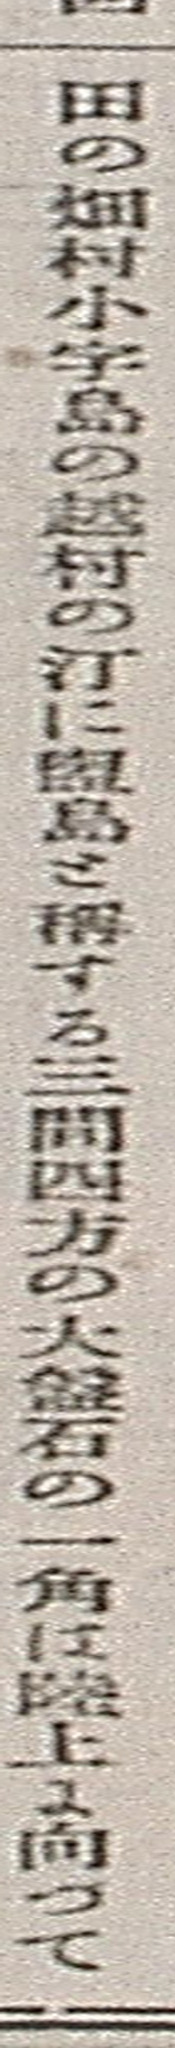田の畑村小字島の越村の汀に盥島と称する三間四方の大磐石の一角は陸上に向かって
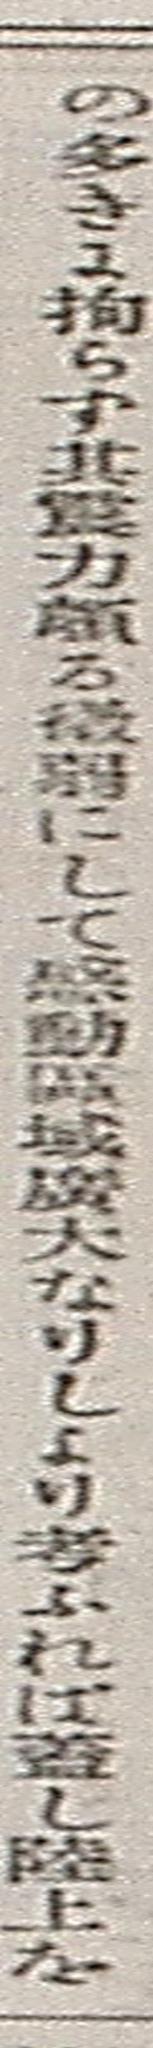の多きに拘らず其震力頗る微弱にして感動区域広大なりしより考ふれば蓋し陸上を
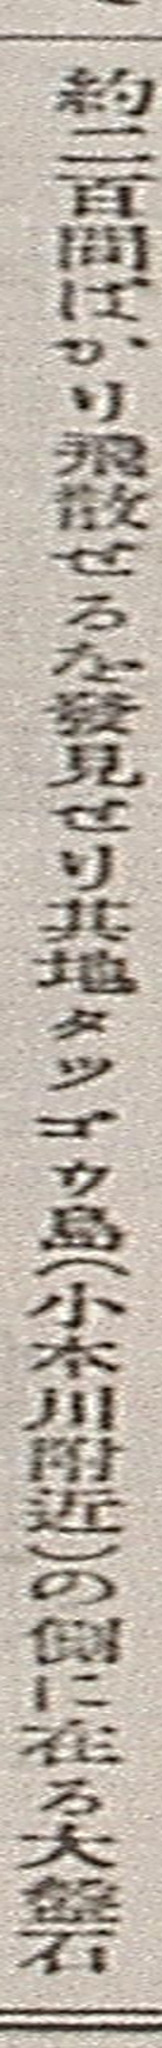約二百間ばかり飛散せるを発見せり其他タツゴウ島の側に在る大磐石
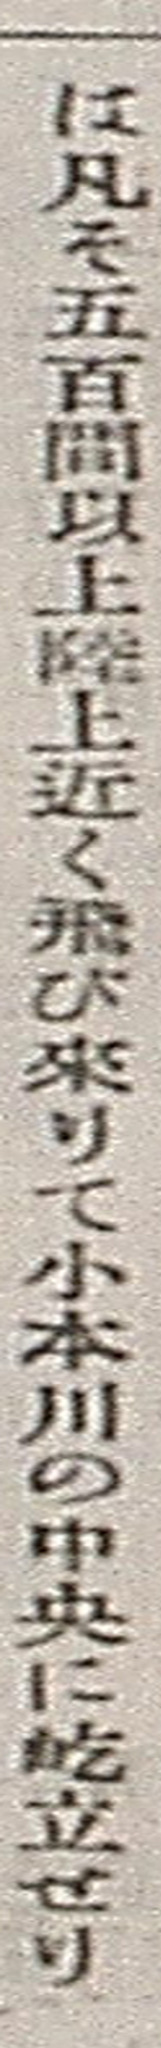は凡そ五百間以上陸上近く飛び来りて小本川の中央に屹立せり
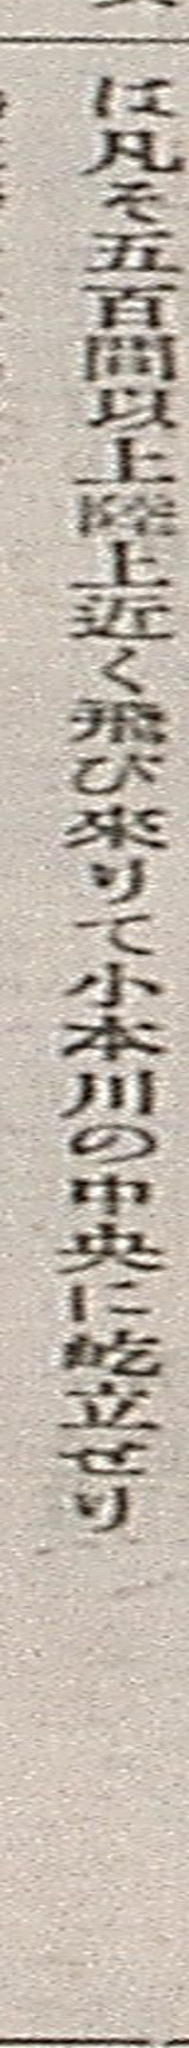は凡そ五百間以上陸上近く飛び来りて小本川の中央に屹立せり
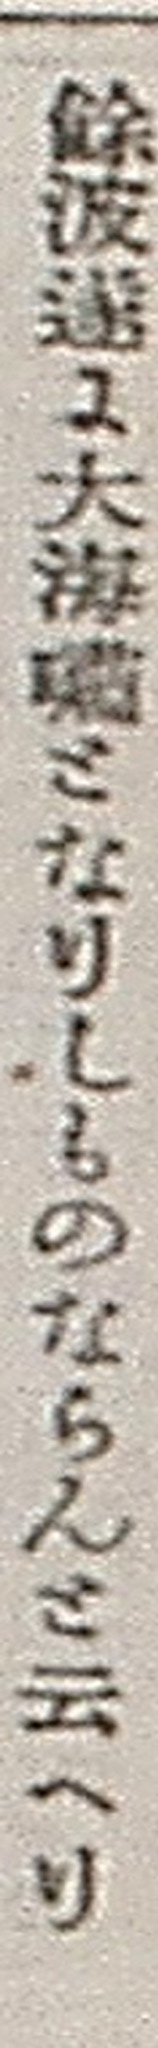余波遂に大海嘯となりしものならんと云へり
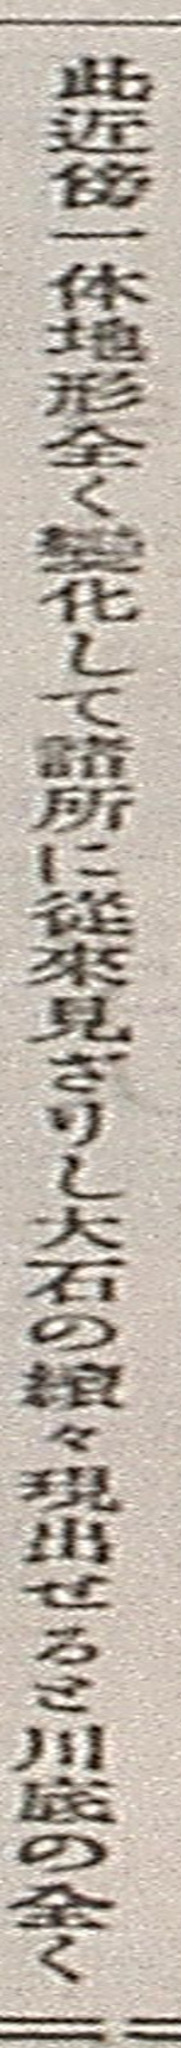此近傍一体地形全く変化して諸所に従来見ざりし大石の続々現出せると川底の全く
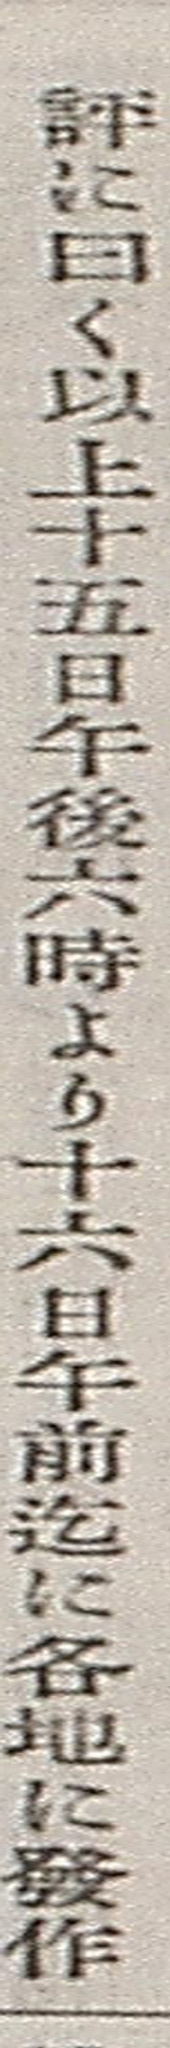評に曰く以上十五日午後六時より十六日午前迄に各地に発作
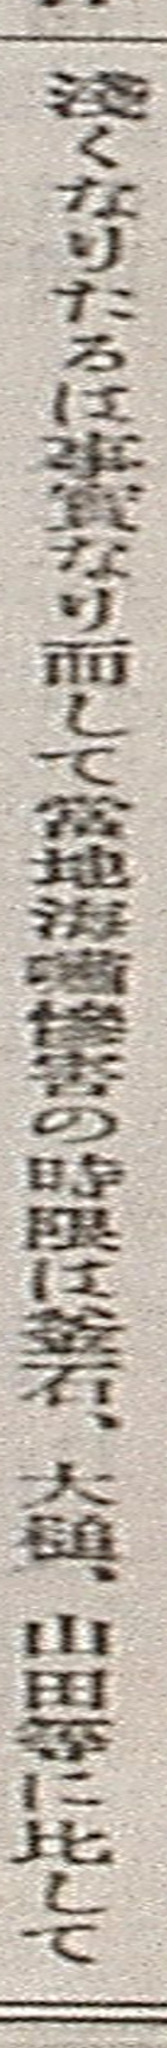浅くなりたるは事実なり而して当地海嘯惨害の時限は釜石、大槌、山田等に比して
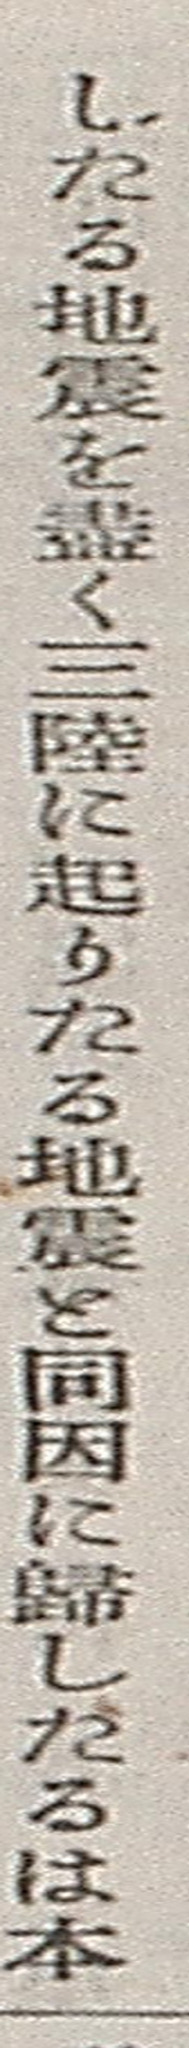したる地震を尽く三陸に起りたる地震と同因に帰したるは本
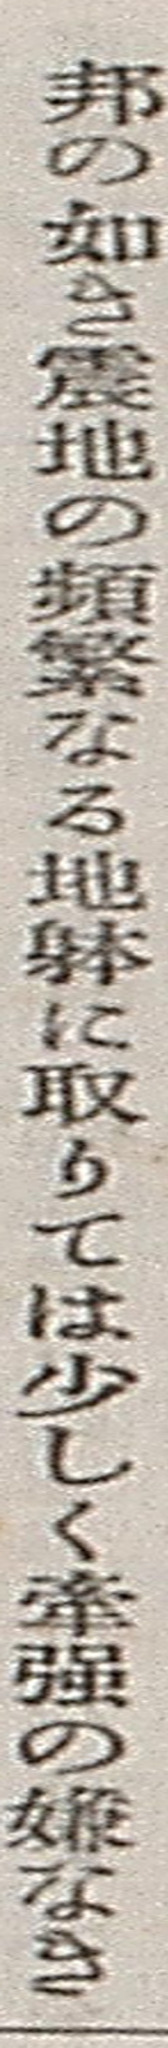邦の如き震地の頻繁なる地体に取りては少しく牽強の嫌なき
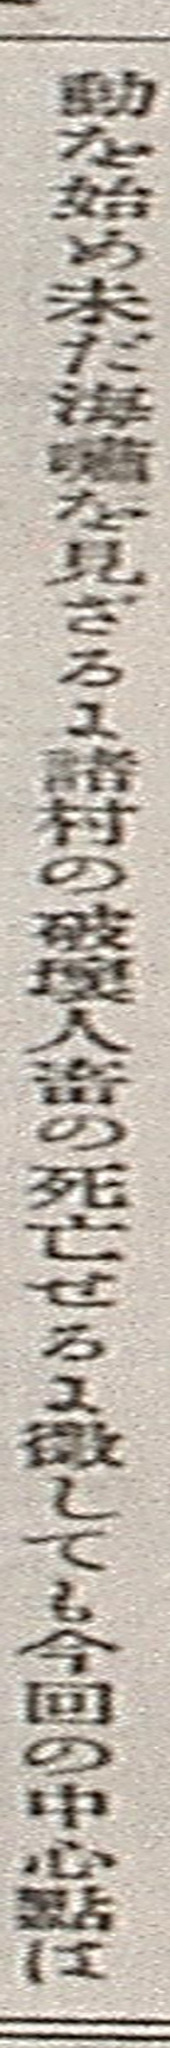動を始め未だ海嘯を見ざるに諸村の破壊人畜の死亡せるに徴しても今回の中心点は
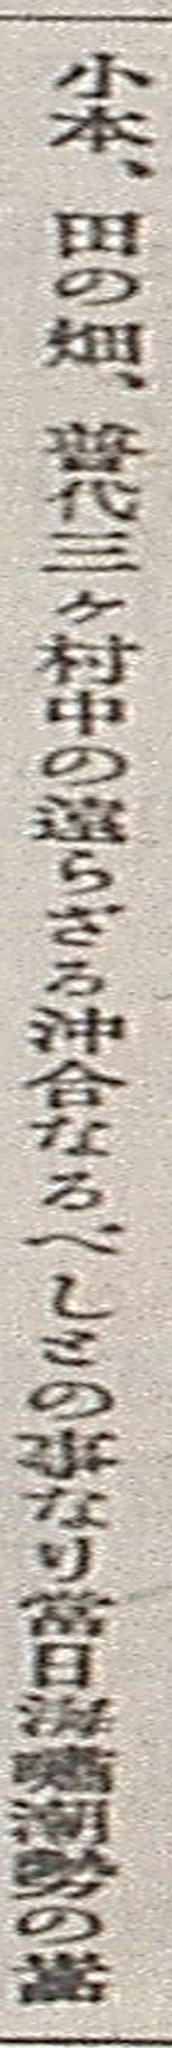小本、田の畑、普代三ヶ村中の遠らざる沖合なるべしとの事なり常日海嘯潮勢の嵩
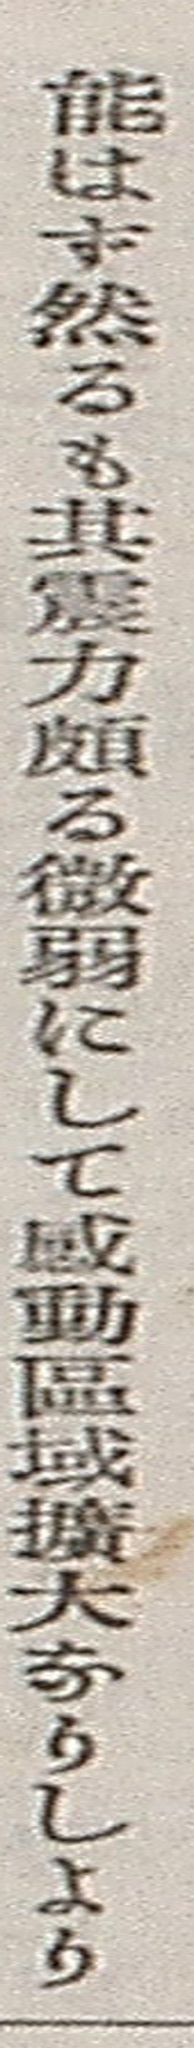能はず然るも其震力頗る微弱にして感動区域広大なりしより
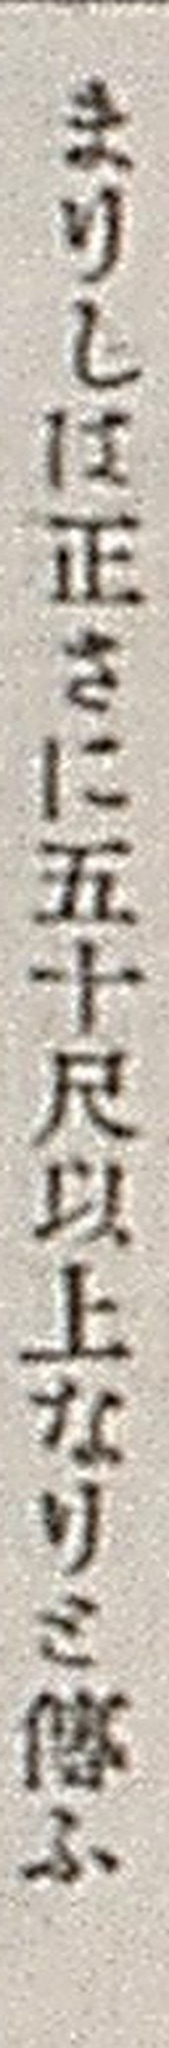まりしは正さに五十尺以上なりと伝ふ
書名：風俗畫報臨時増刊第百十九號　大海嘯被害録（中）
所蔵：東京大学地震研究所図書室 Earthquake Research Institute Library, The University of Tokyo, JAPAN
